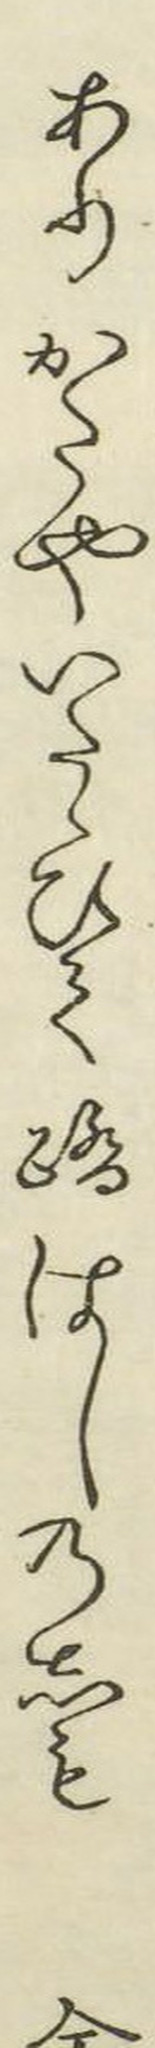ありかたやいたゝひて踏はしのしも仝
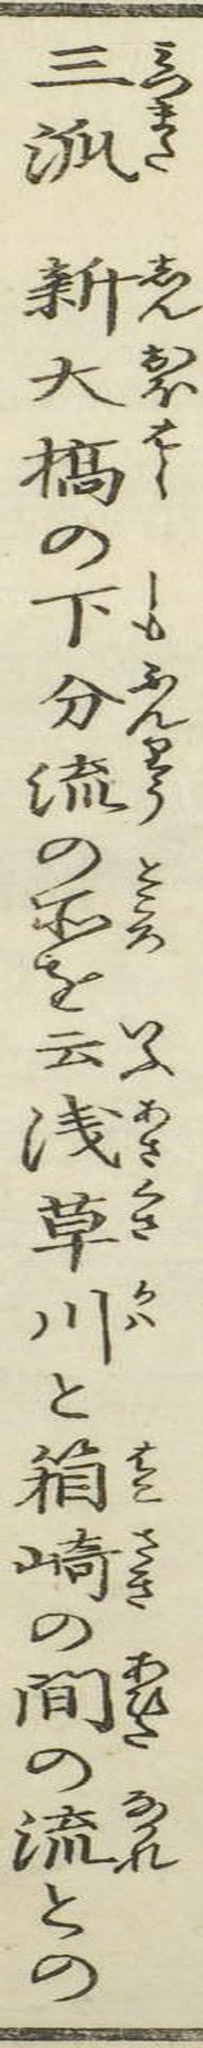三派新大橋の下分流の所を云浅草川と箱崎の間の流との
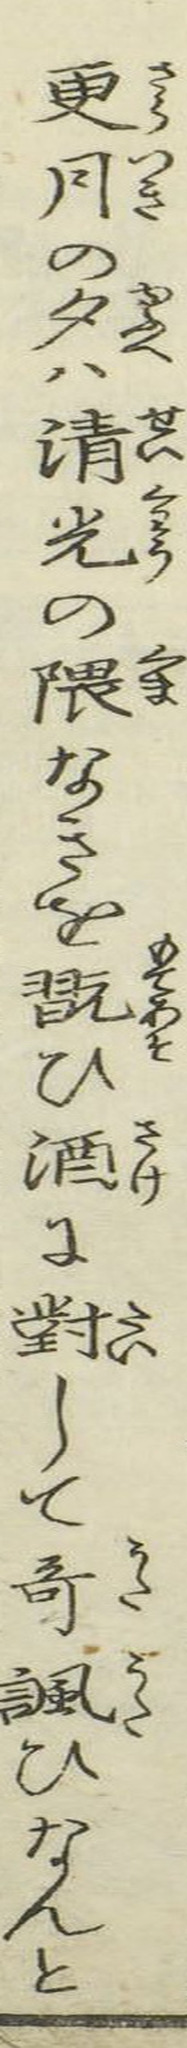更月の夕は清光の隈なきを翫ひ酒に對して哥諷ひなんと
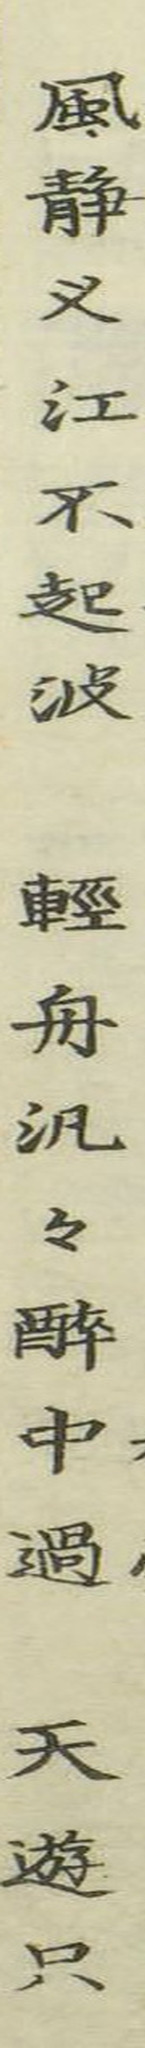風静叉江不起波軽舟汎々酔中過天遊只

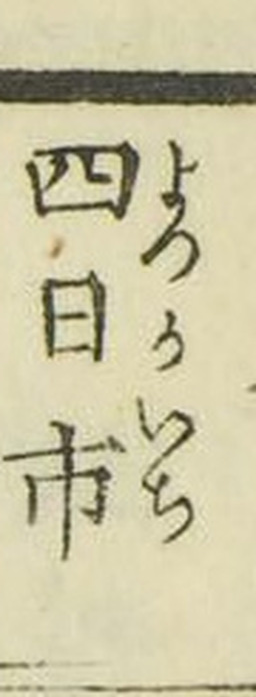四日市
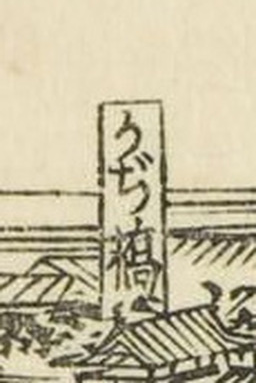うぢ橋
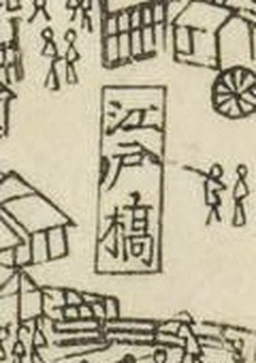江戸橋

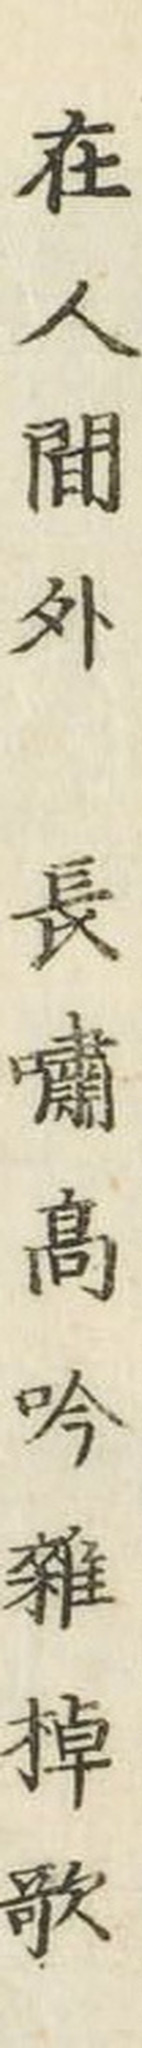在人間外長嘯高吟雑棹歌
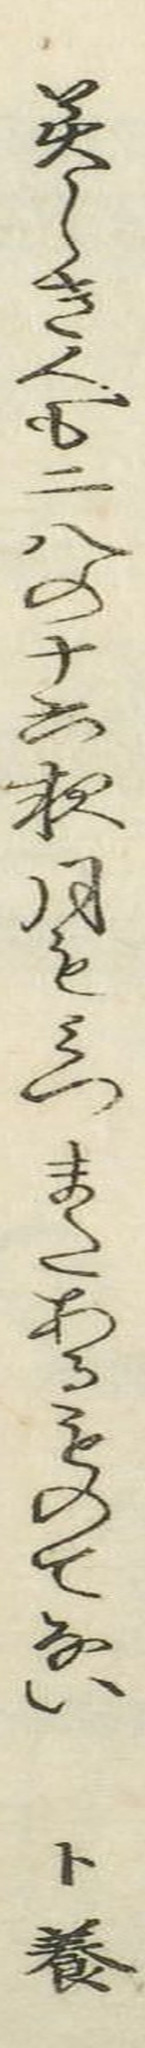美しき人も二八の十六夜月もみつまたあるものてない卜養
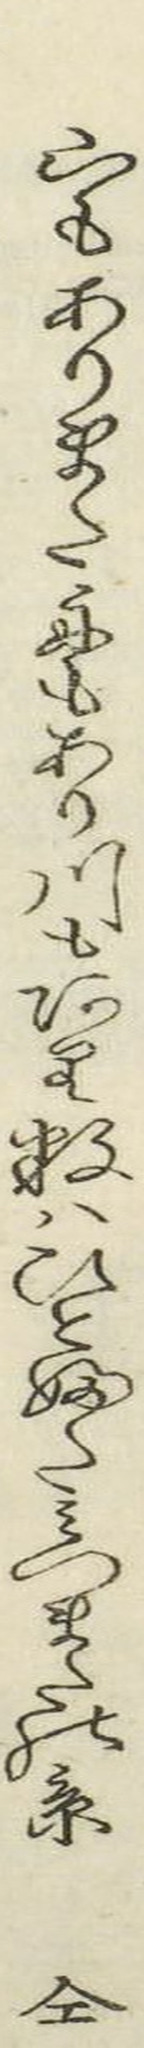山もありまた舟もあり川もあり数はひとふたみつまたの景仝
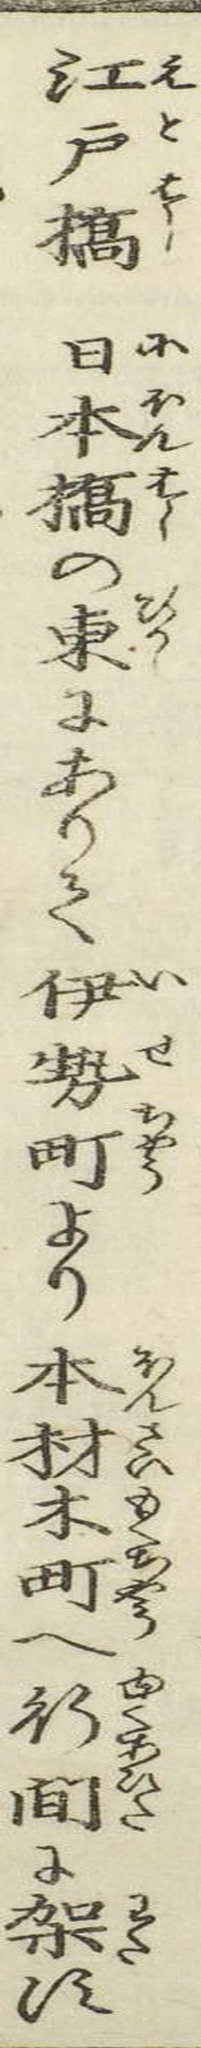江戸橋日本橋の東にありて伊勢町より本材木町へ行間に架す
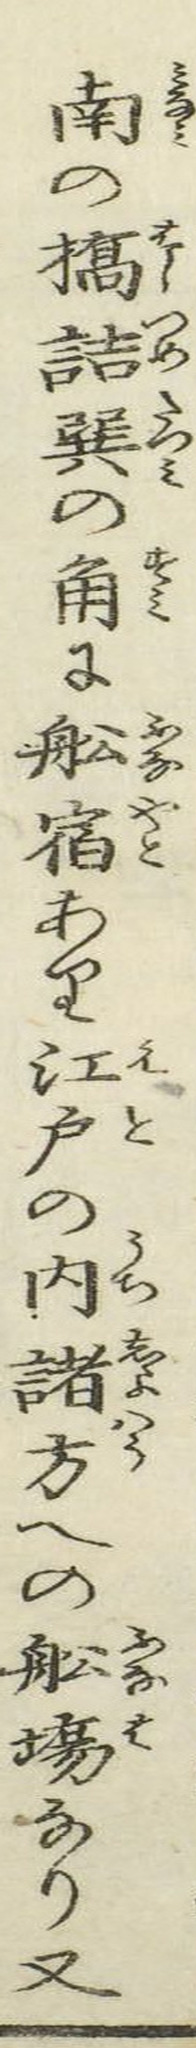南の橋詰巽の角に船宿あり江戸の内諸方への船場なり又
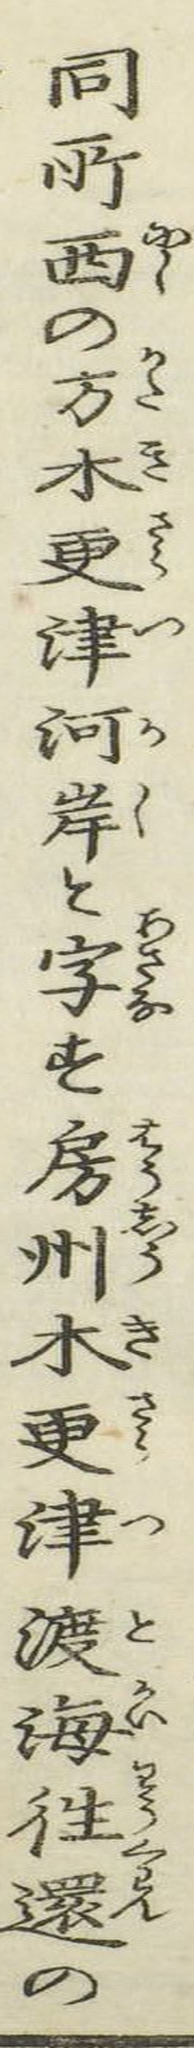同所西の方木更津河岸と字す房州木更津渡海往還の
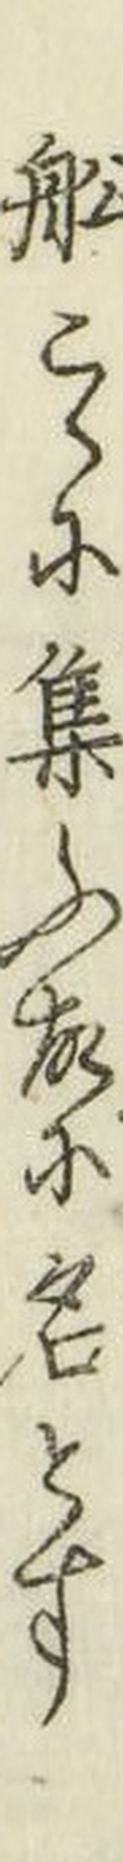船こゝに集ふ故に名とす
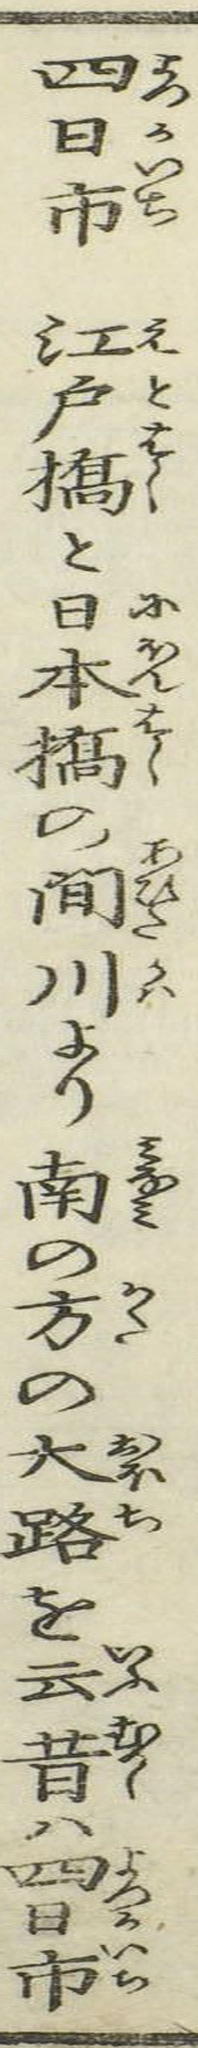四日市江戸橋と日本橋の間川より南の方の大路を云昔は四日市
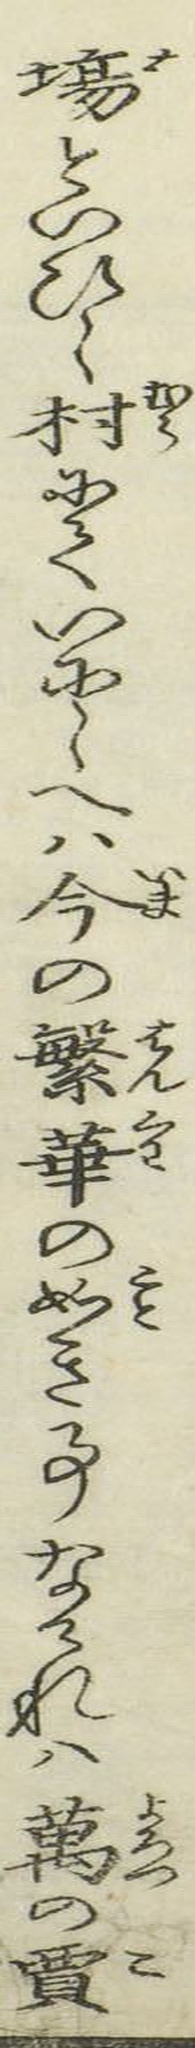場といひし村にていにしへは今の繫華の如き事なけれは萬の賈
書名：江戸名所図会 20巻 巻之2
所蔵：東京学芸大学教育コンテンツアーカイブ
